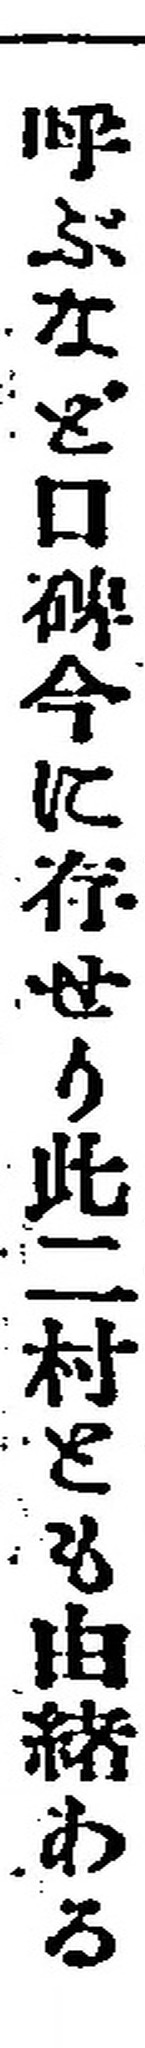呼ぶなど口碑今に存せり此二村とも由緒ある
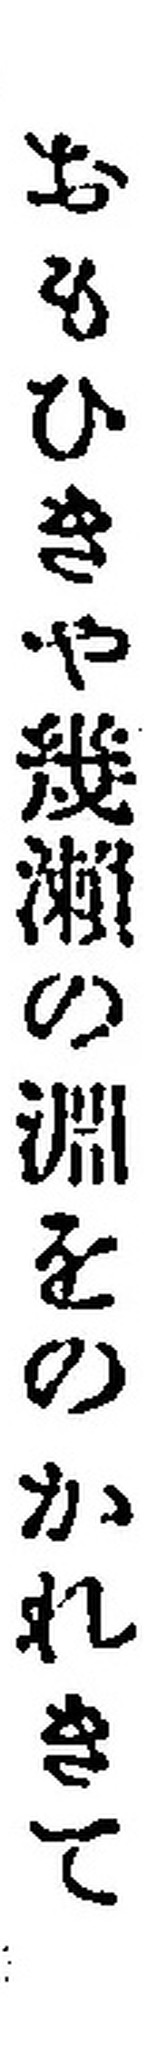おもひきや幾瀬の淵をのかれきて
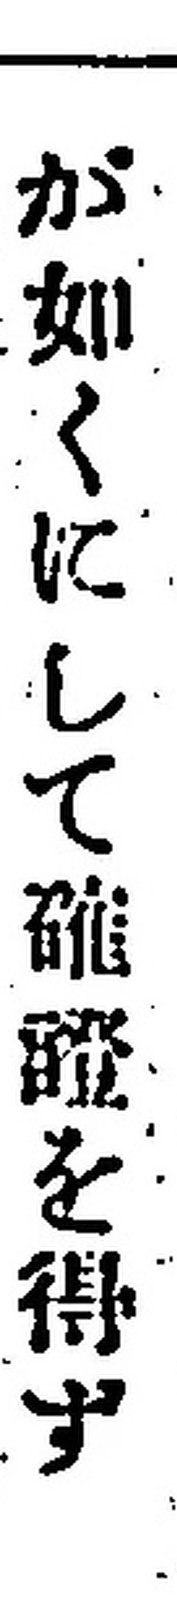が如くにして確証を得ず
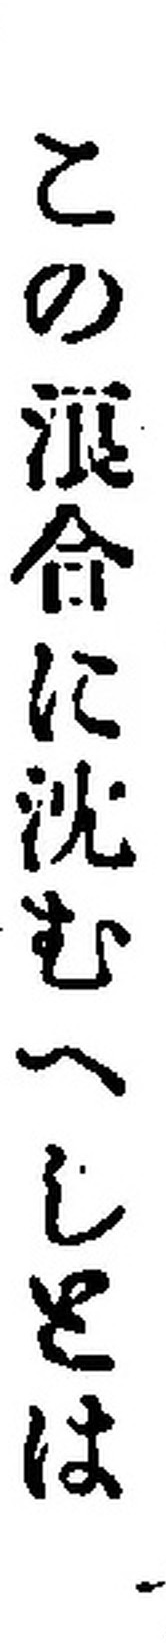この浪合に沈むへしとは
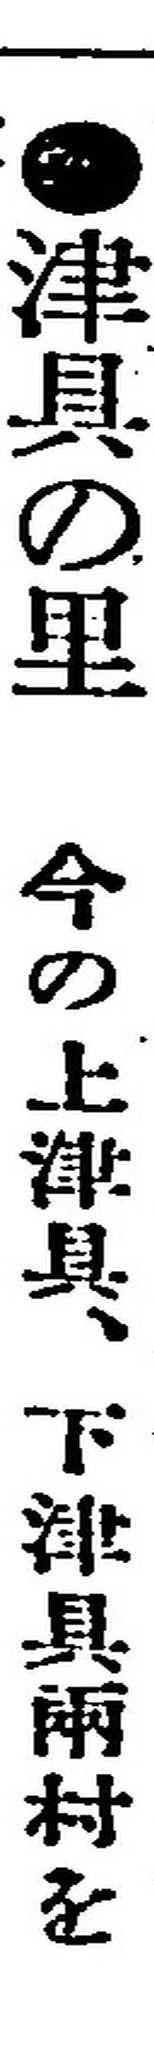●津具の里今の上津具、下津具両村を
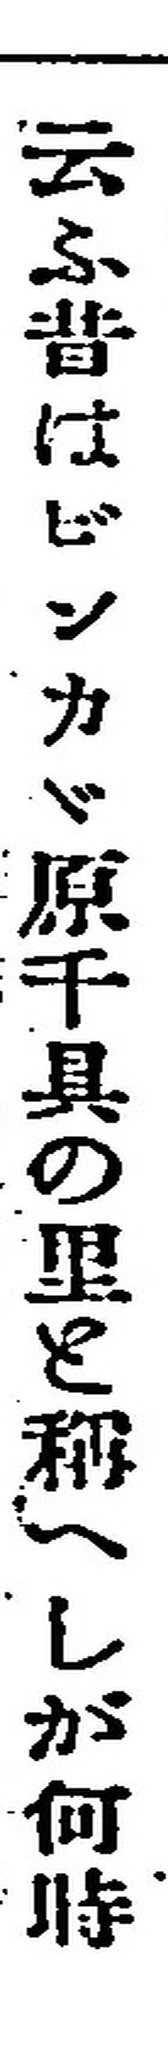云ふ昔はビンカヾ原千具の里と称へしが何時
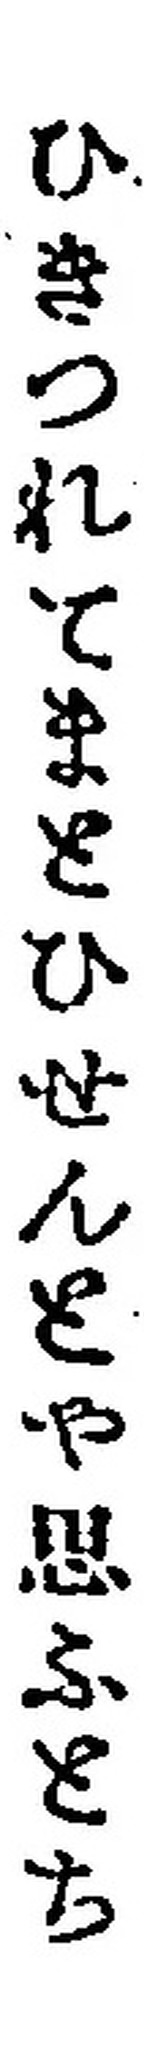ひきつれてまとひせんとや思ふとち
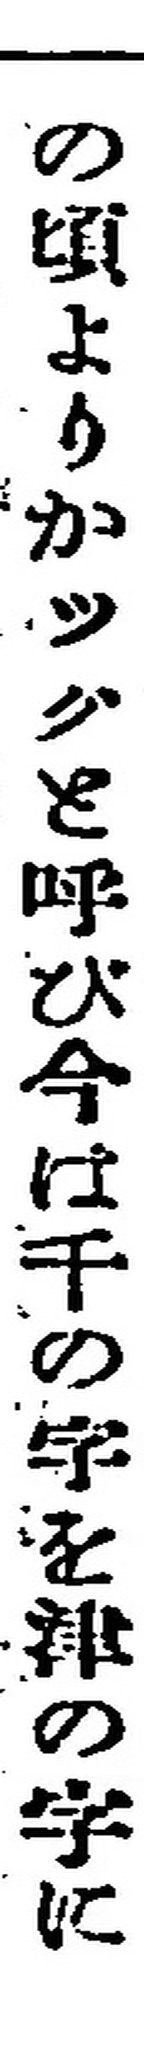の頃よりかツグと呼び今は千の字を津の字に
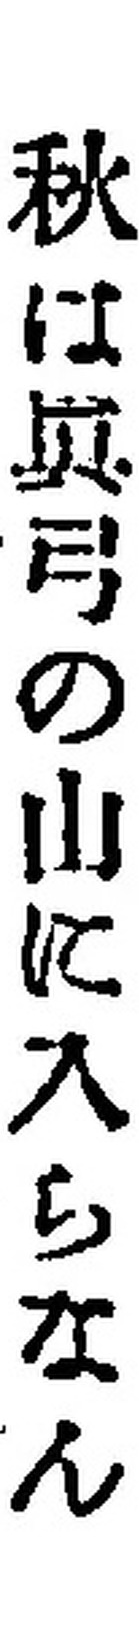秋は真弓の山に入らなん
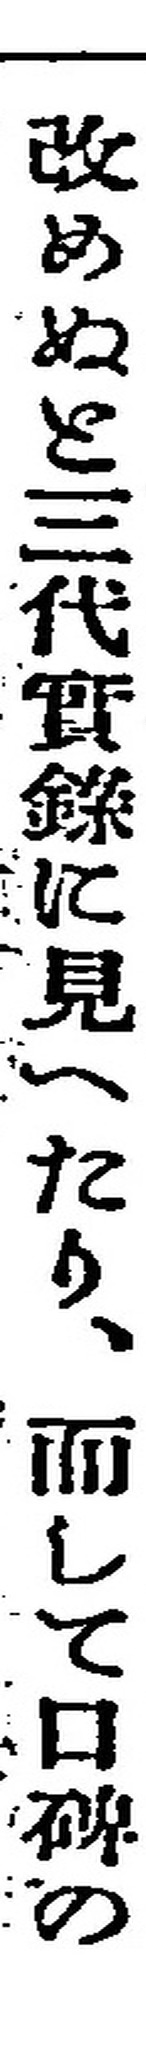改めぬと三代実録に見へたり、而して口碑の
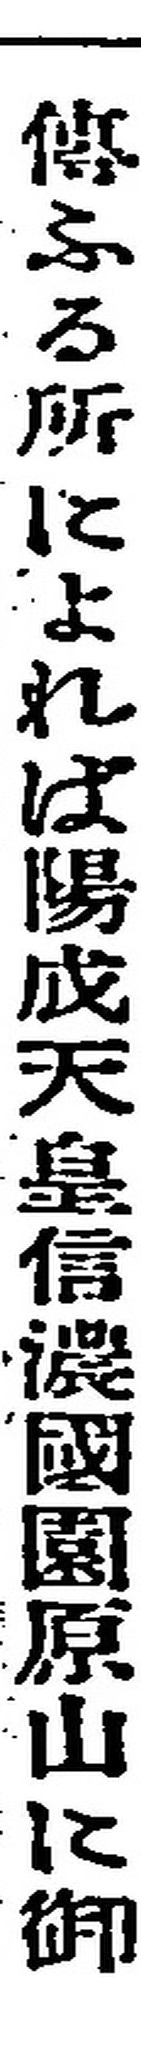伝ふる所によれば陽成天皇信濃国園原山に御
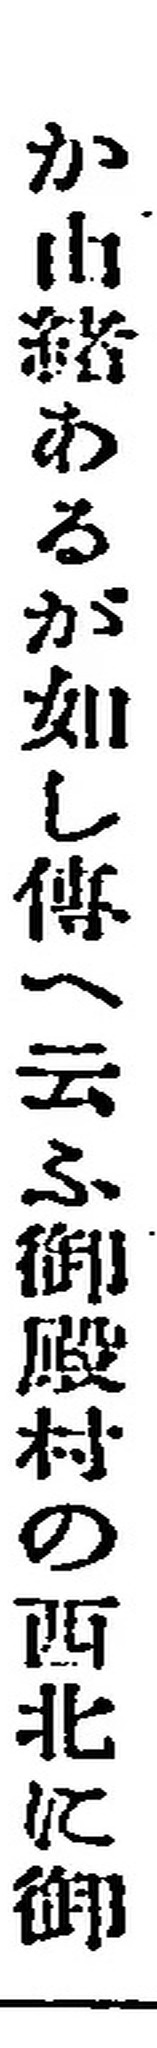か由緒あるが如し伝へ云ふ御殿村の西北に御
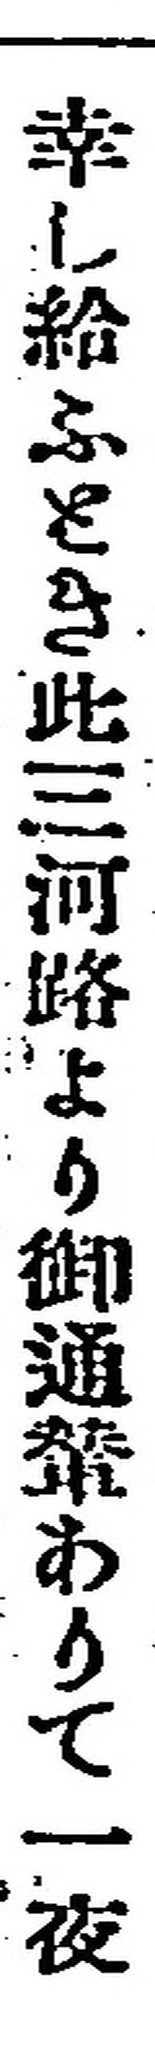幸し給ふとき此三河路より御通輦ありて一夜
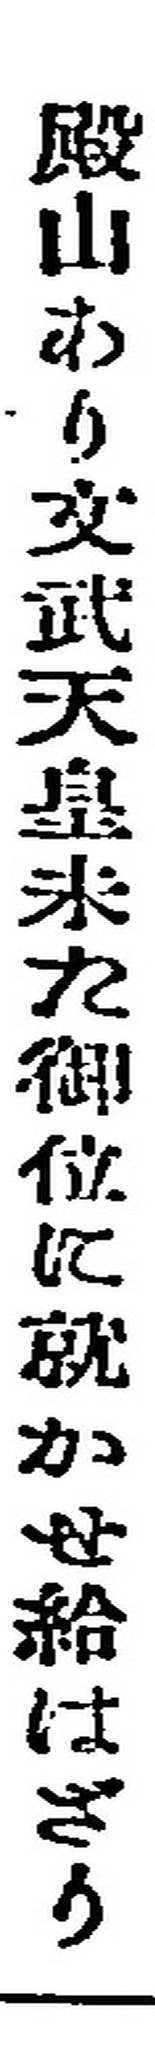殿山あり文武天皇未た御位に就かせ給はざり
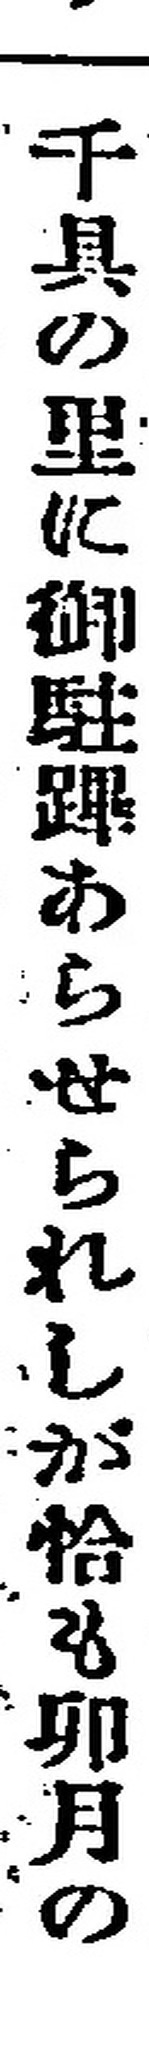千具の里に御駐蹕あらせられしが恰も卯月の
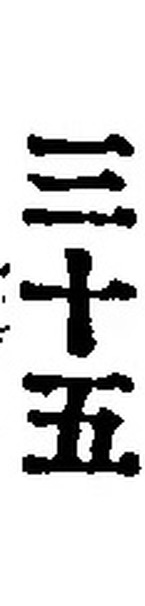三十五
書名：東参名勝案内
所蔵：国立国会図書館 National Diet Library, JAPAN
